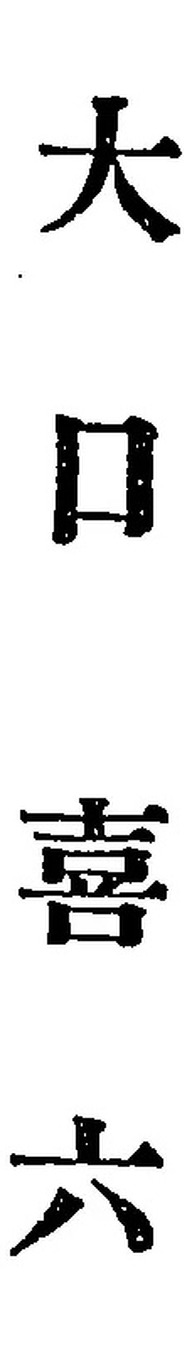大口喜六
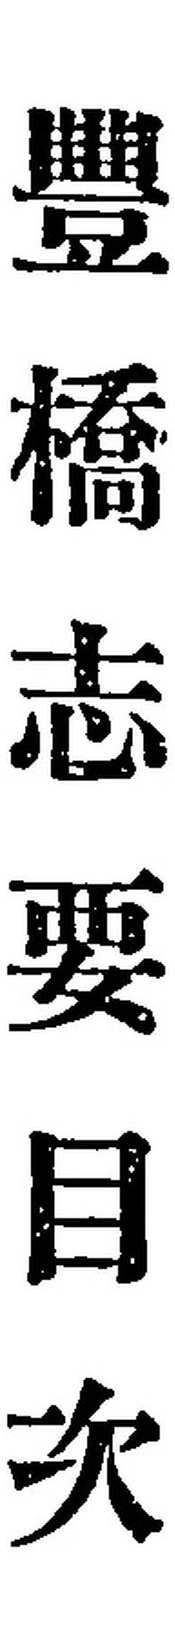豐橋志要目次

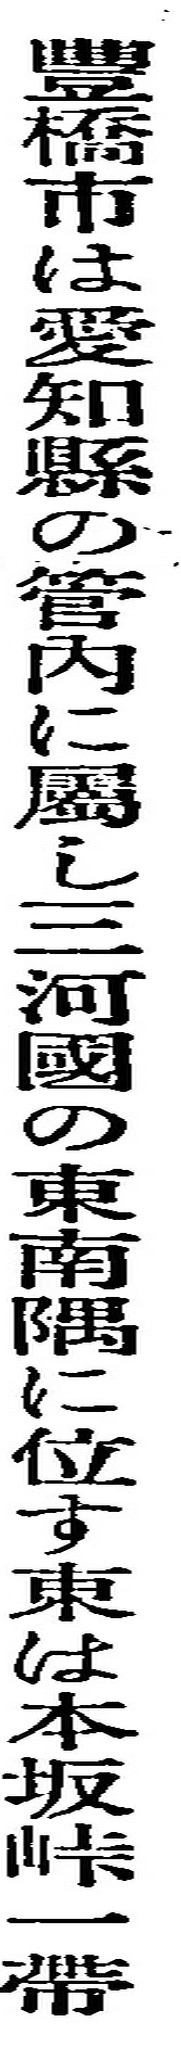豐橋市は愛知懸の管内に屬し三河國の東南隅に位す東は本坂峠一帶
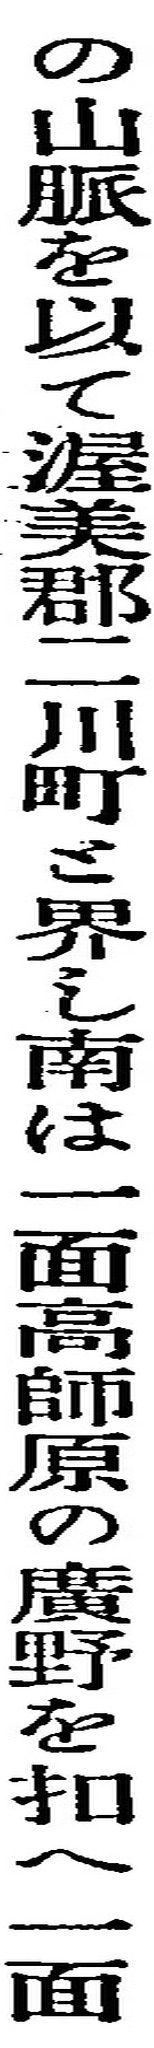の山脈を以て渥美郡二川町と界し南は一面高師原の廣野を扣へ一面
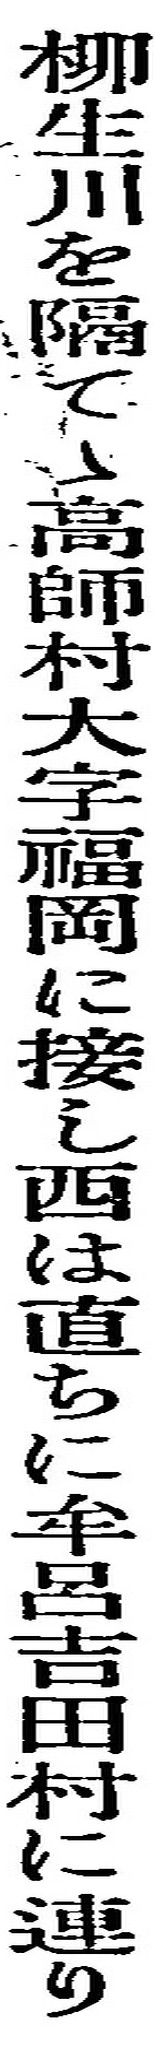柳生川を隔てゝ高師村大字福岡に接し西は直ちに牟呂吉田村に連り
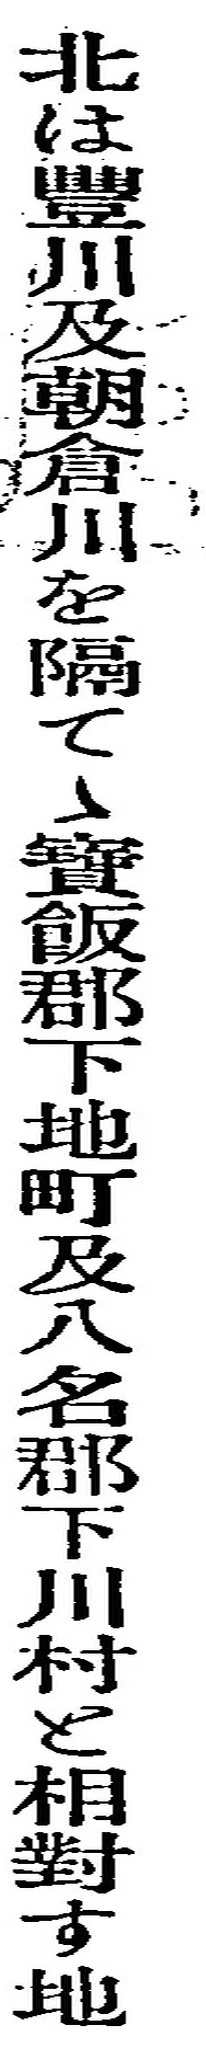北は豐川及朝倉川を隔てゝ寶飯郡下地町及八名郡下川村と相對す地
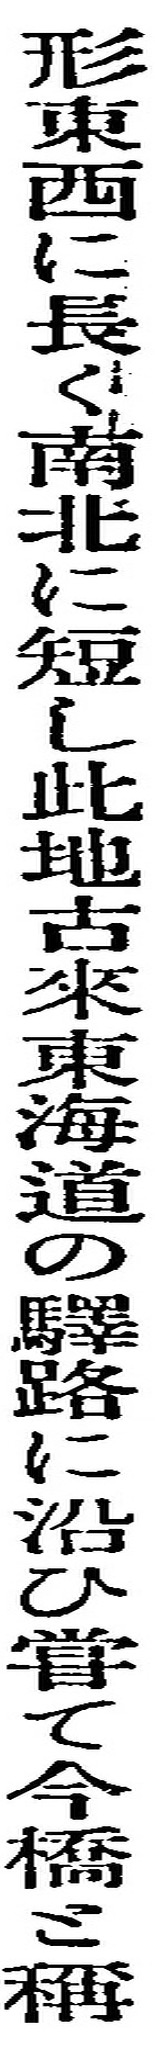形東西に長く南北に短し此地古來東海道の驛路に沿ひ甞て今橋と稱
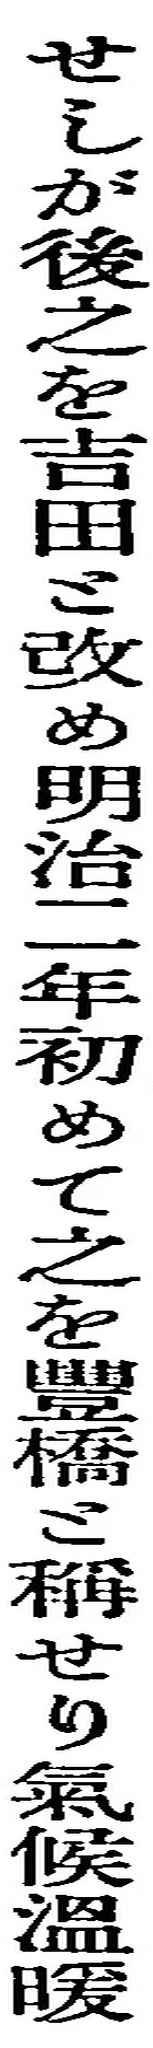せしが後之を吉田と改め明治二年初めて之を豐橋と稱せり氣候溫暖
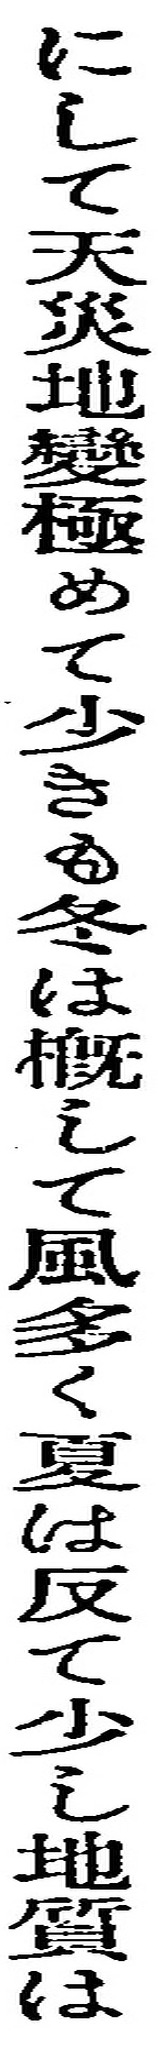にして天災地變極めて少きも冬は槪して風多く夏は反て少し地質は
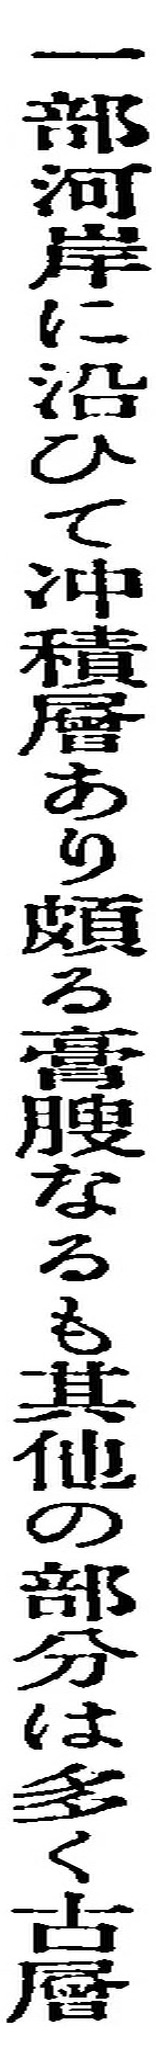一部河岸に沿ひて沖積層あり頗る膏膄なるも其他の部分は多く古層
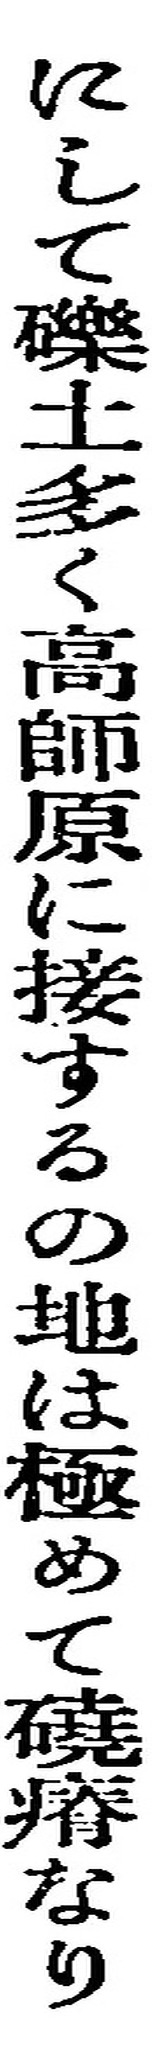にして礫土多く高師原に接するの地は極めて磽瘠なり
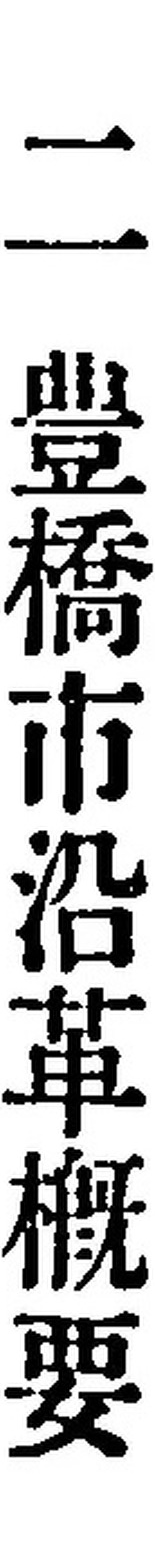二豊橋市沿革槪要

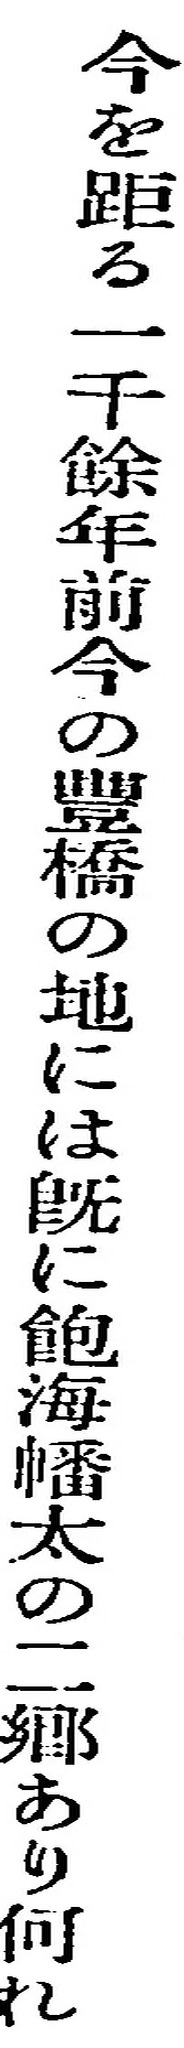今を距る一千餘年前今の豐橋の地には既に飽海幡太の二鄕あり何れ
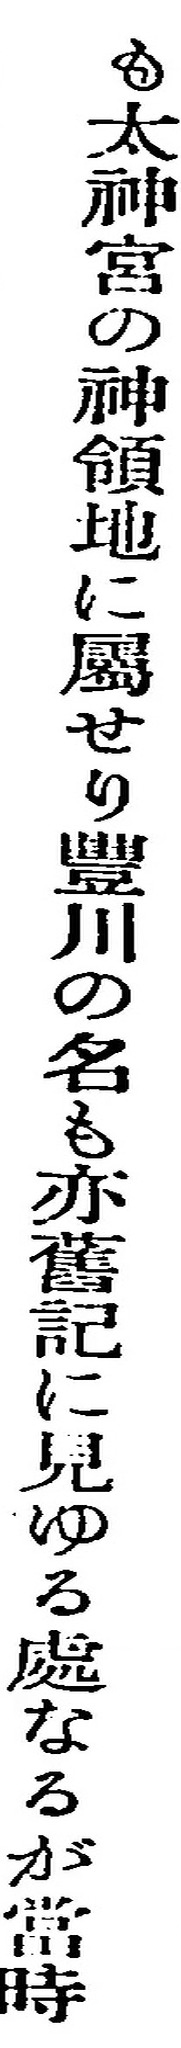も太神宮の神領地に屬せり豐川の名も亦舊記に見ゆる處なるが當時
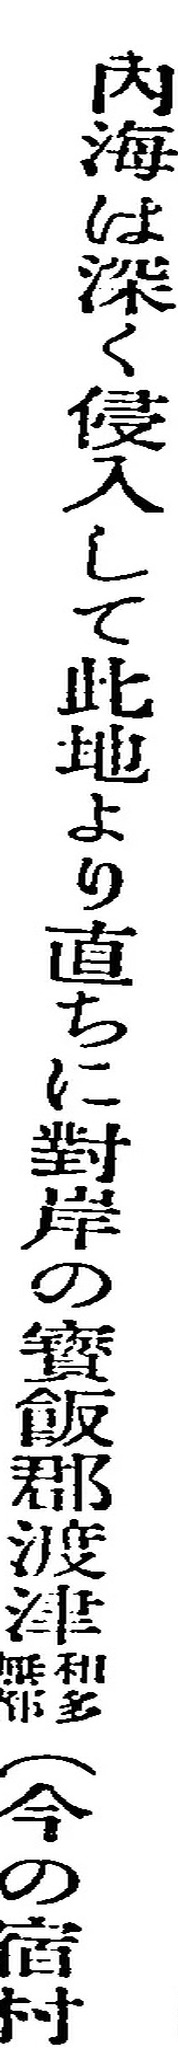内海は深く侵入して此地より直ちに對岸の寶飯郡渡津和多無都(今の宿村
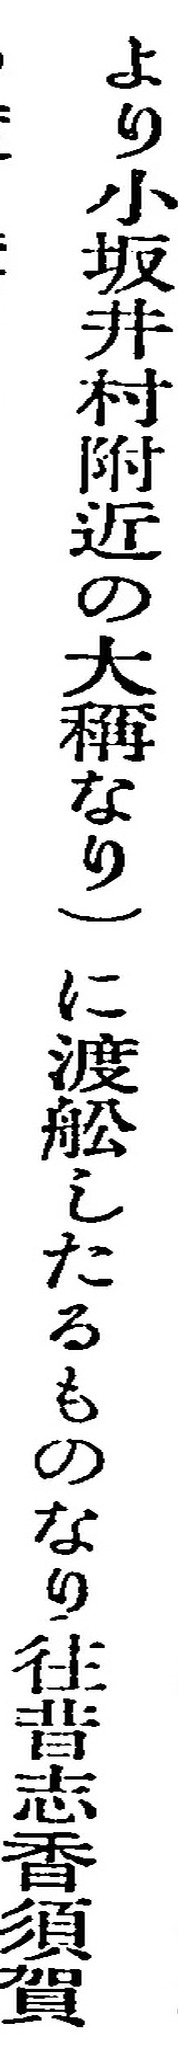より小坂井村附近の大稱なり)に渡舩したるものなり往昔志香須賀
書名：豊橋志要
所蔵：国立国会図書館 National Diet Library, JAPAN
